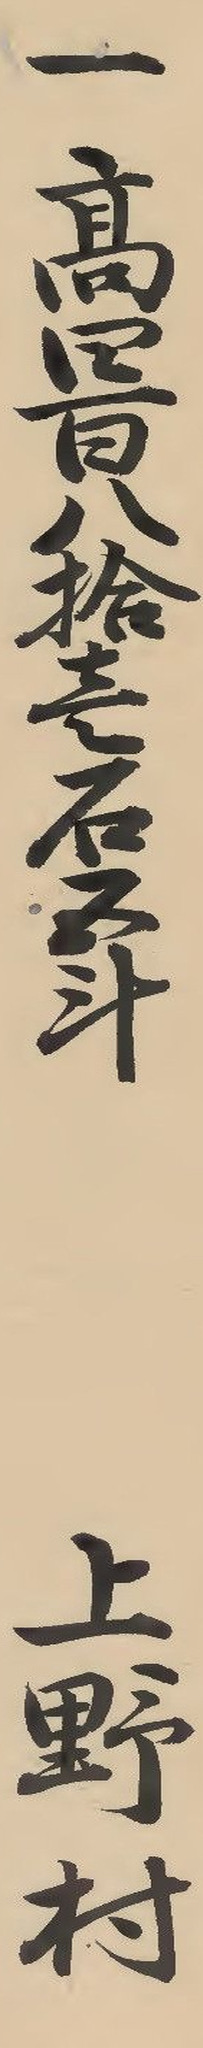一高四百八拾壱石五斗上野村
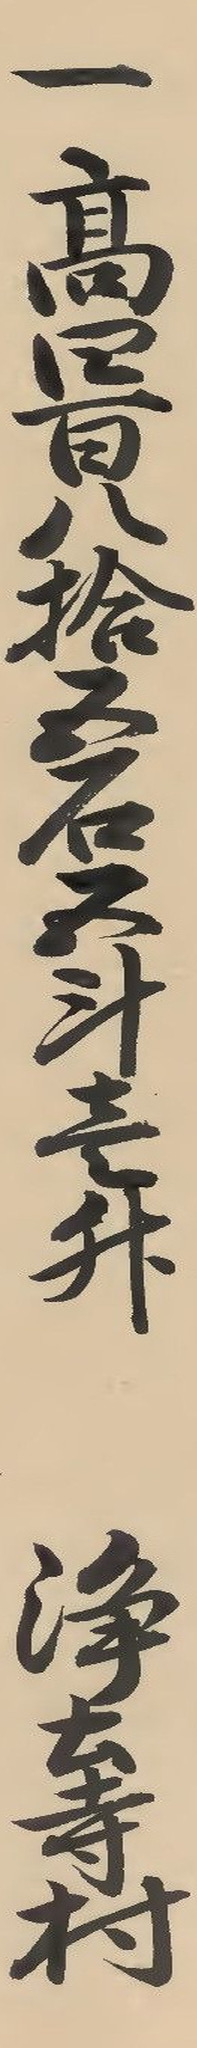一高四百八拾五石五斗壱升浄土寺村
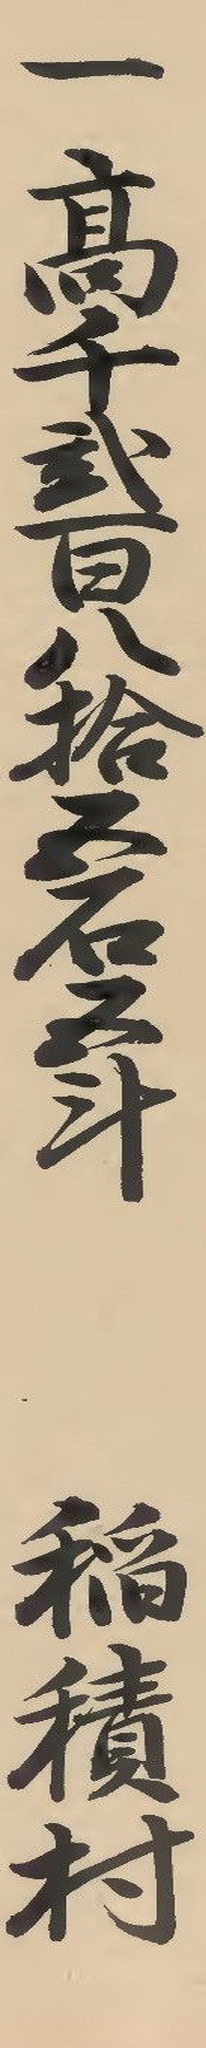一高千弐百八拾五石五斗稲積村
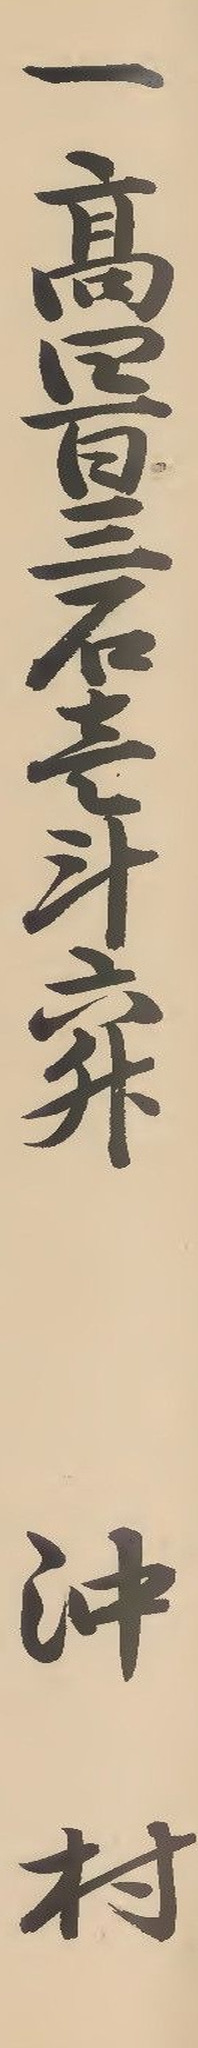一高四百三石壱斗六升沖村
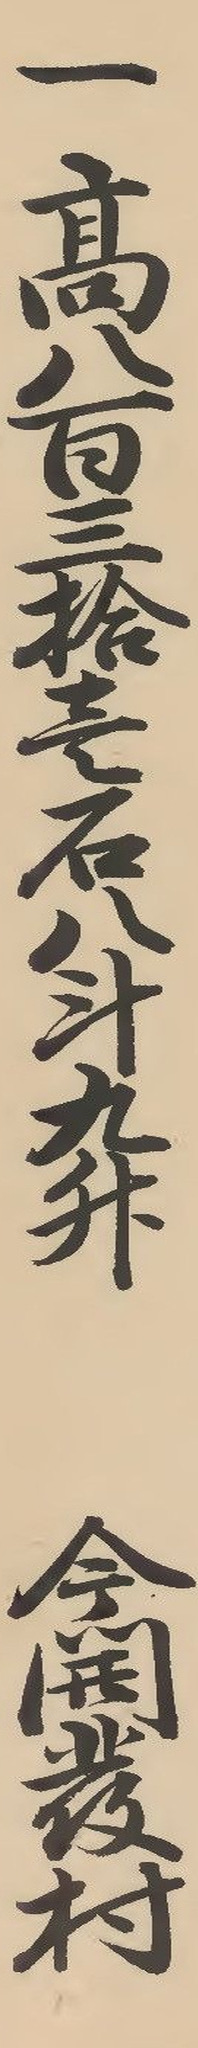一高八百三拾壱石八斗九升今開発村
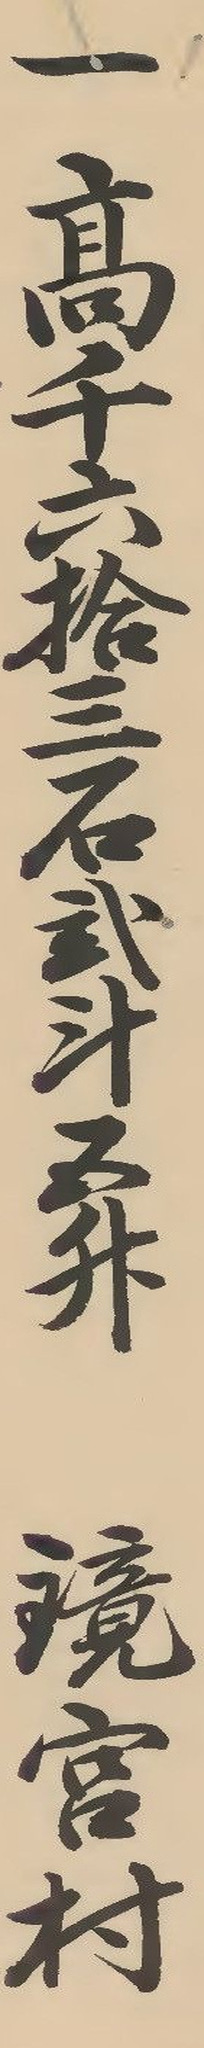一高千六拾三石弐斗五升鏡宮村

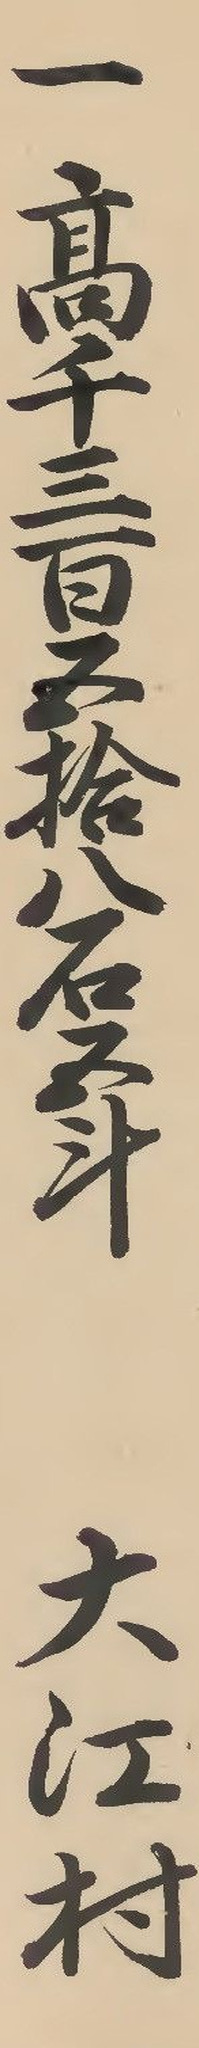一高千三百五拾八石五斗大江村
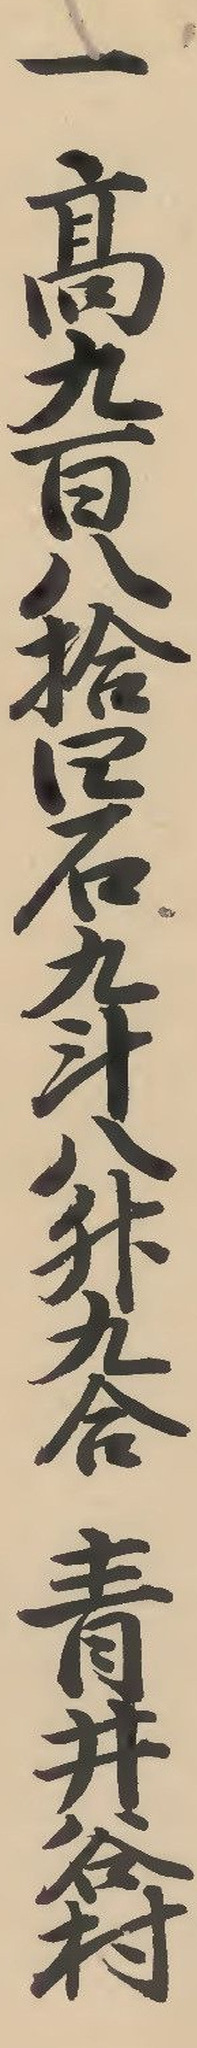一高九百八拾四石九斗八升九合青井谷村

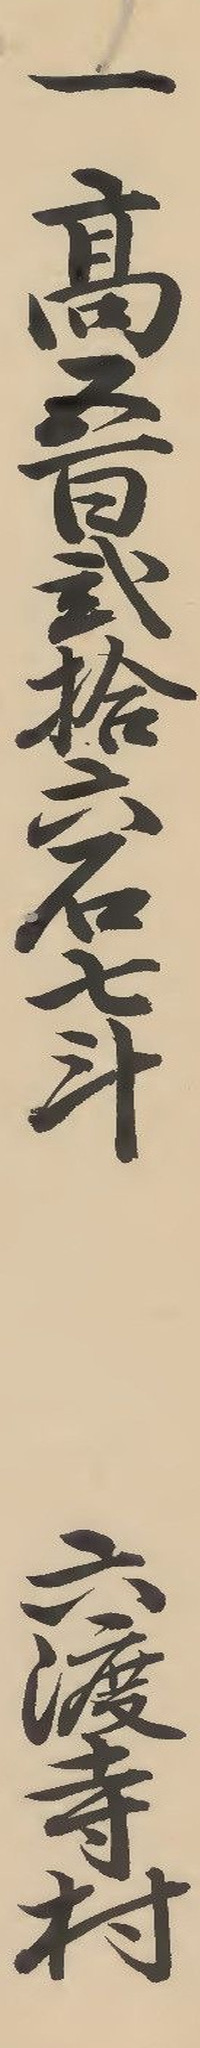一高五百弐拾六石七斗六渡寺村
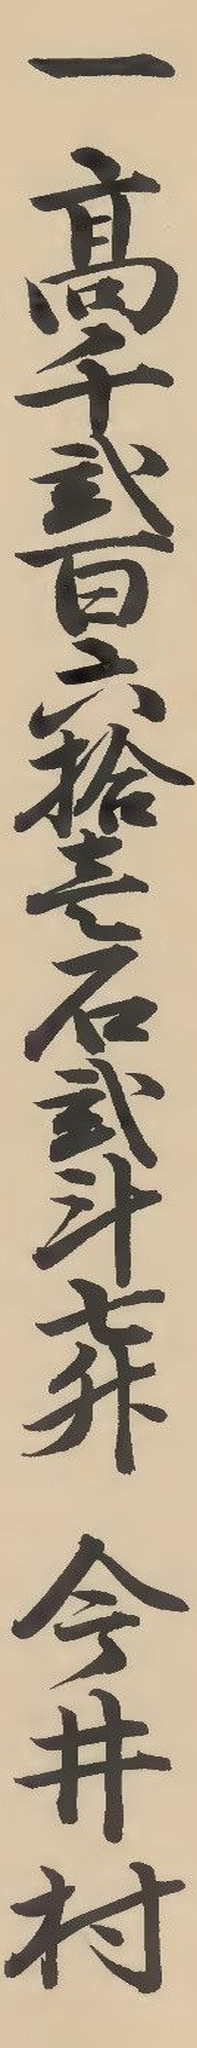一高千弐百六拾壱石弐斗七升今井村
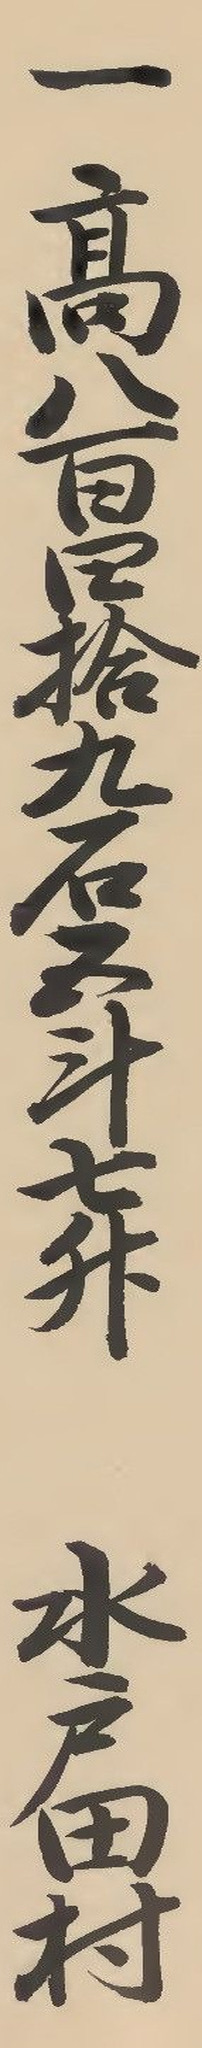一高八百四拾九石五斗七升水戸田村
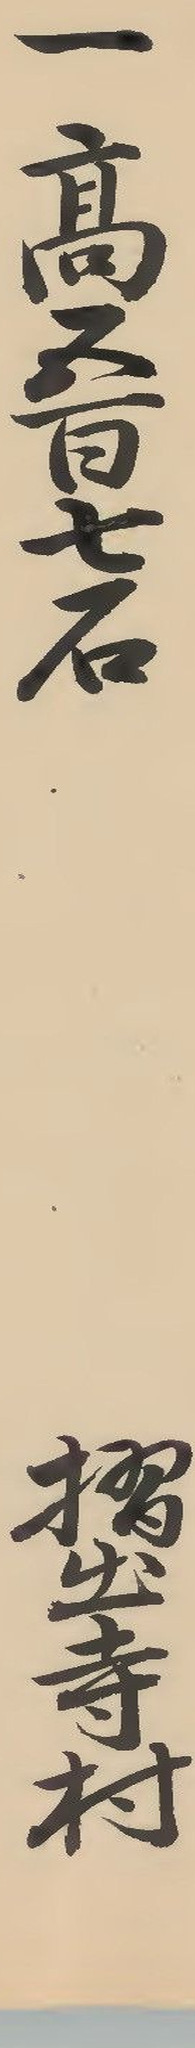一高五百七石摺出寺村
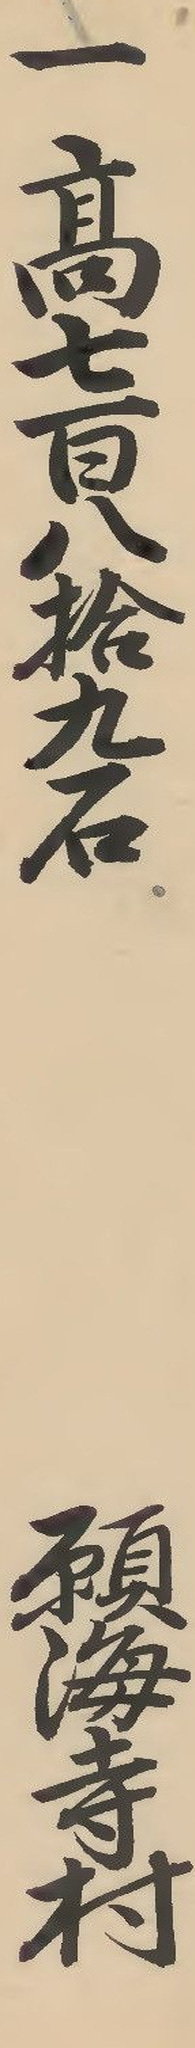一高七百八拾九石願海寺村

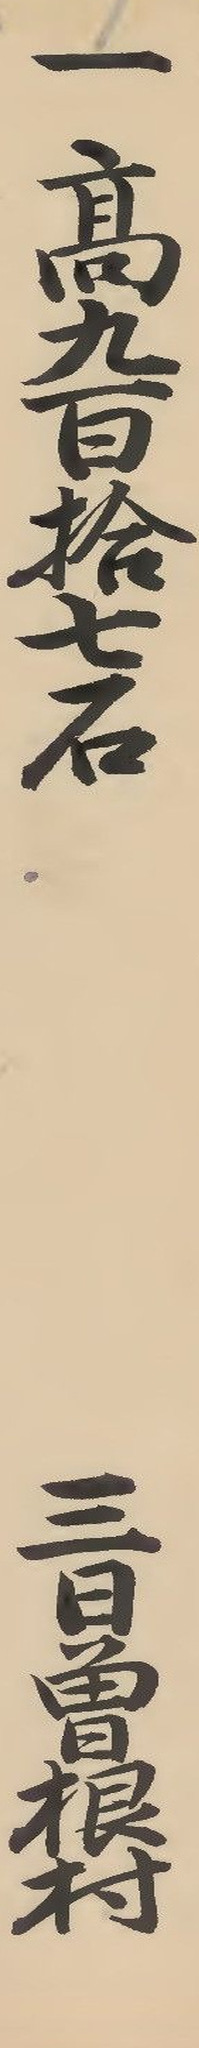一高九百拾七石三日曽根村
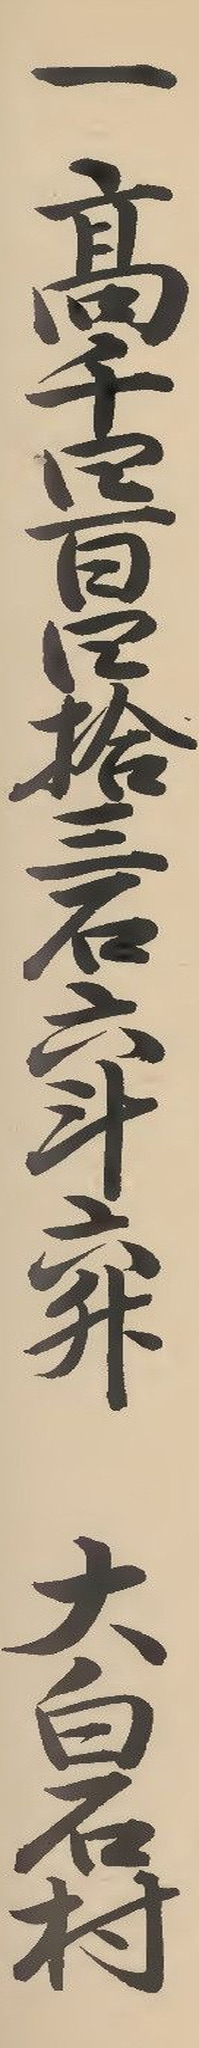一高千四百四拾三石六斗六升大白石村
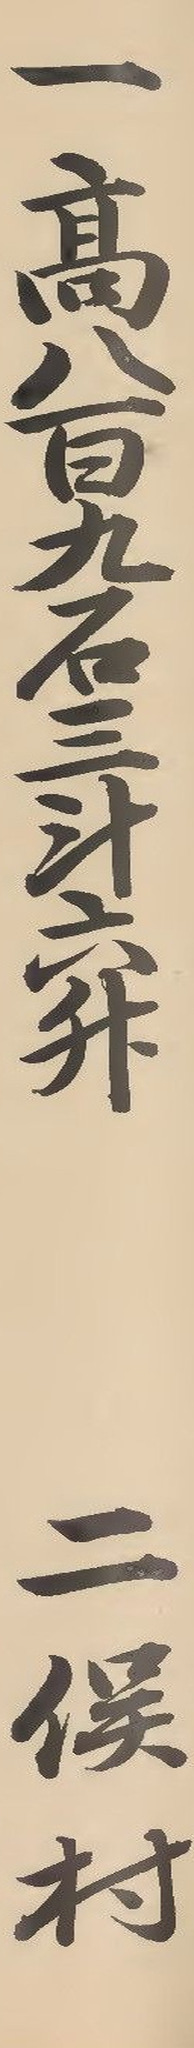一高八百九石三斗六升二俣村
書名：越中国郷帳
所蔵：国立公文書館 National Archives of Japan
